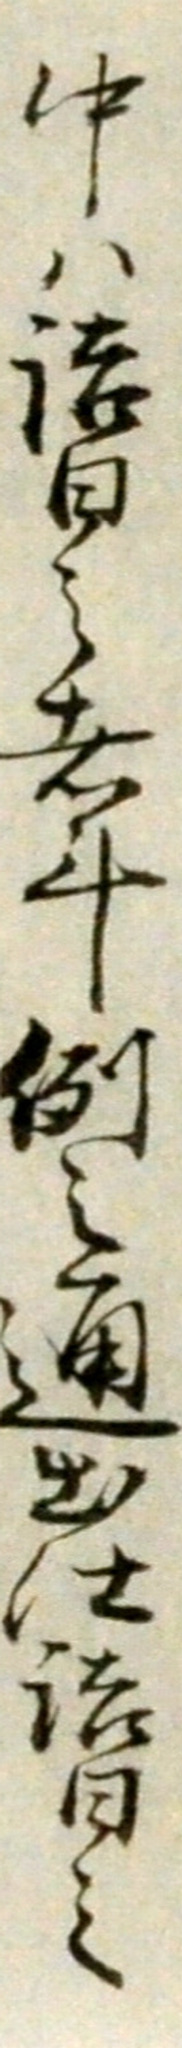中は詰日之者斗例之通出仕詰日之
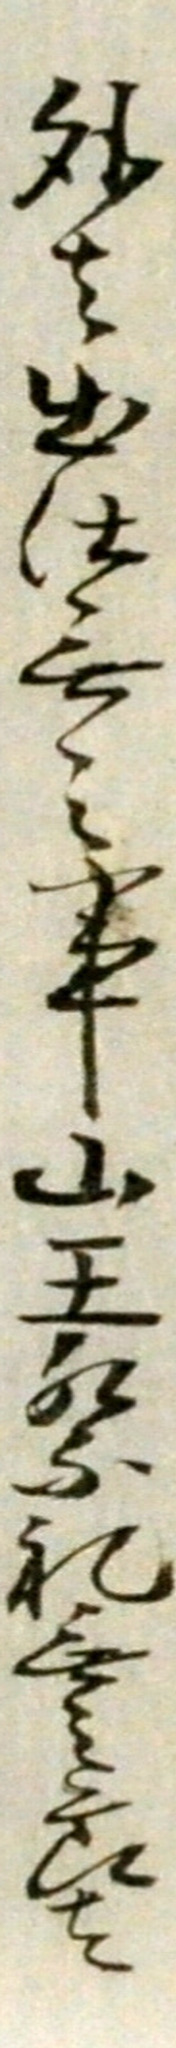外は出仕無之事山王祭礼無之節は
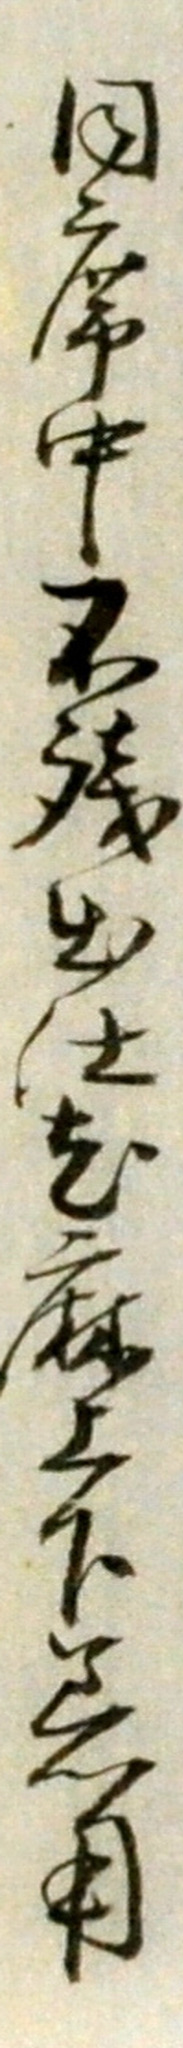同席中不残出仕尤麻上下着用
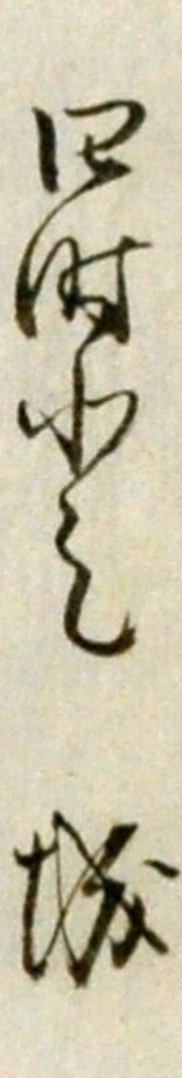四時登城
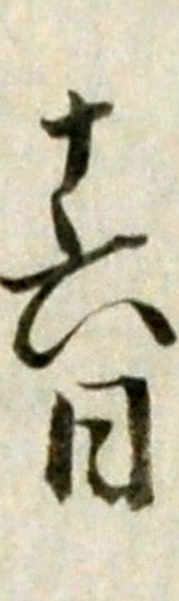十六日
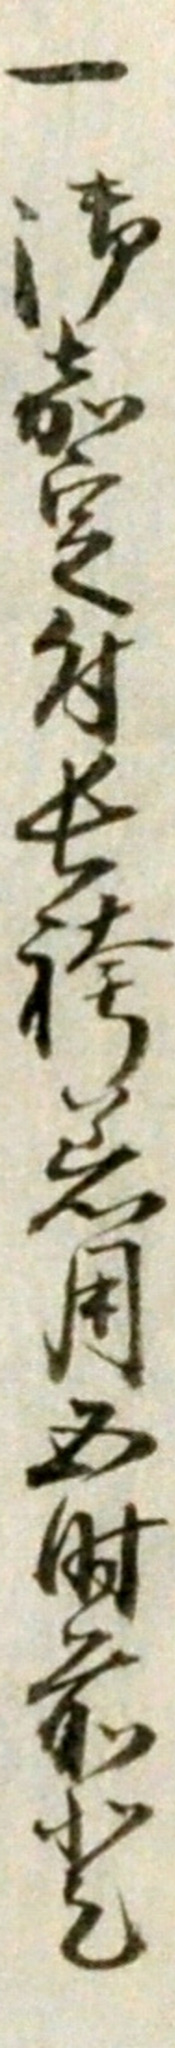一御嘉定付長袴着用五時前登
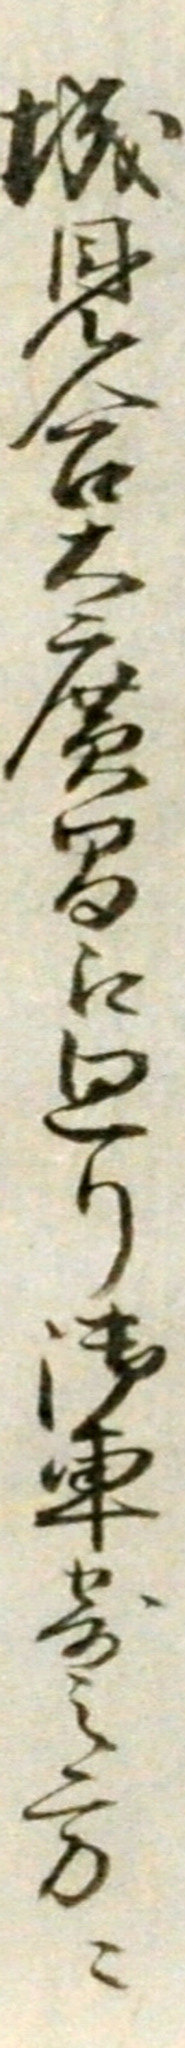城見合大広間え廻り御車寄之方に
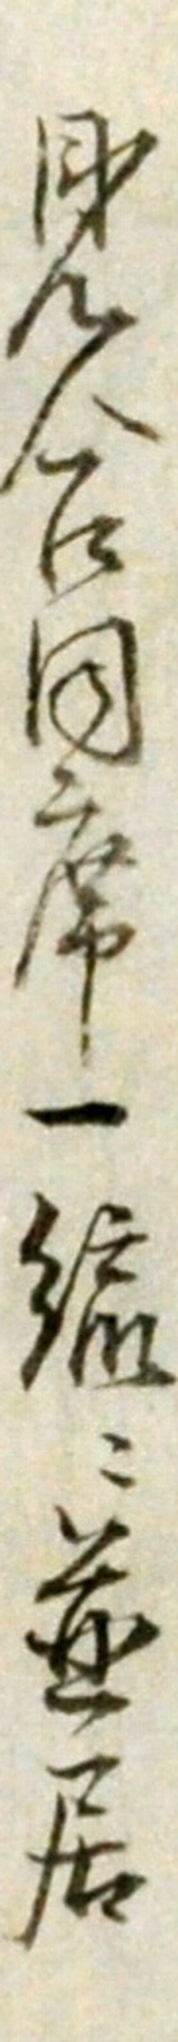見合同席一統に並居
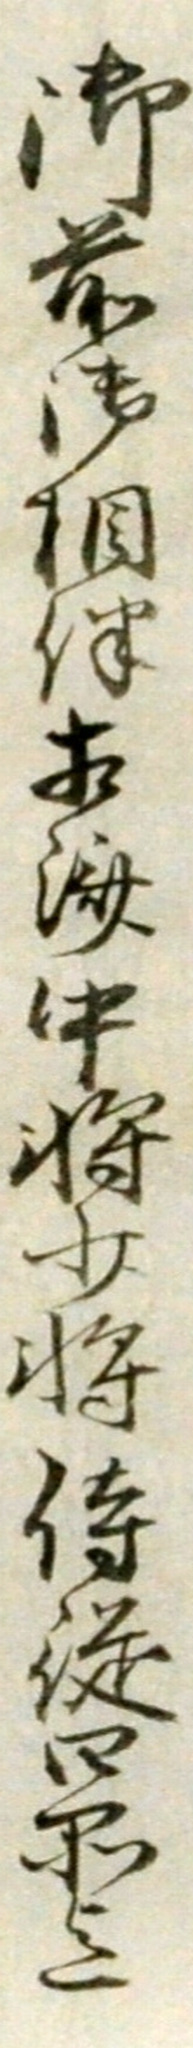御前御相伴相済中将少将侍従四品迄
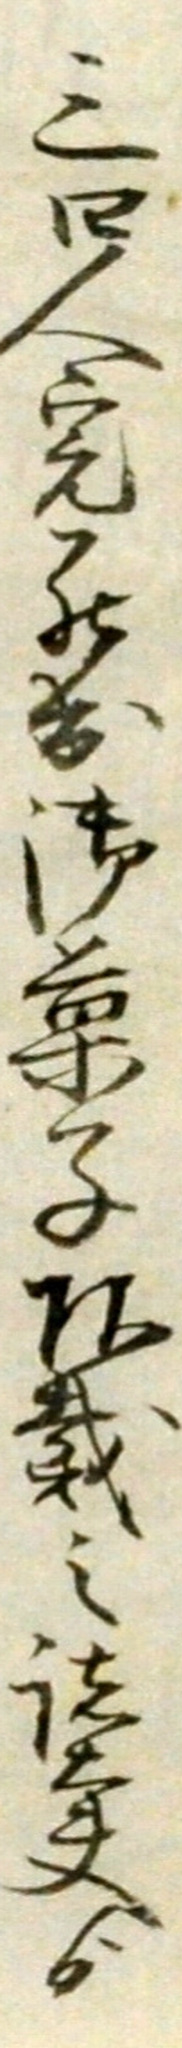三四人宛罷出御菓子頂戴之諸大夫ゟ
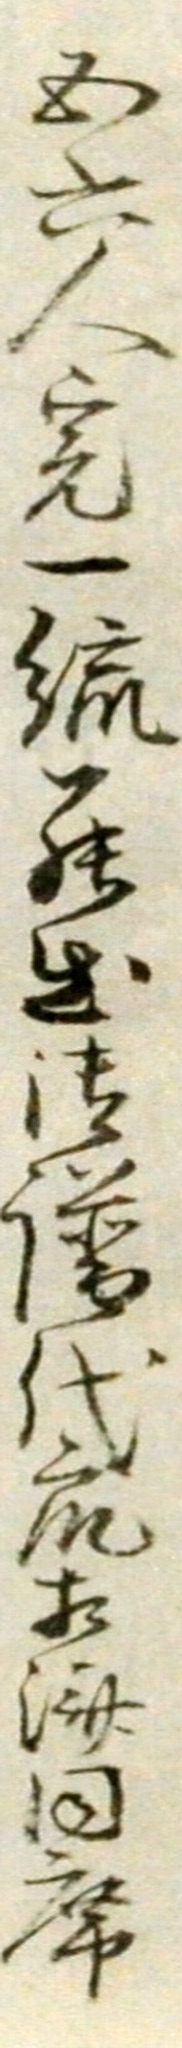五六人宛一統罷出御譜代衆相済同席
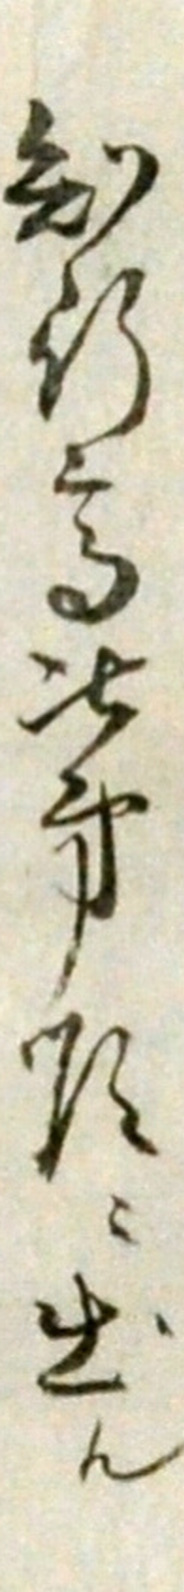知行高次第順に出ル
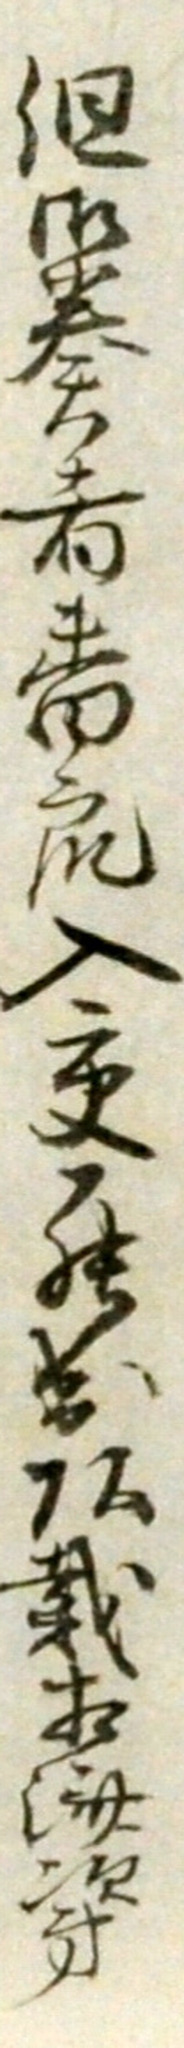但御奏者番衆入交罷出頂戴相済次第
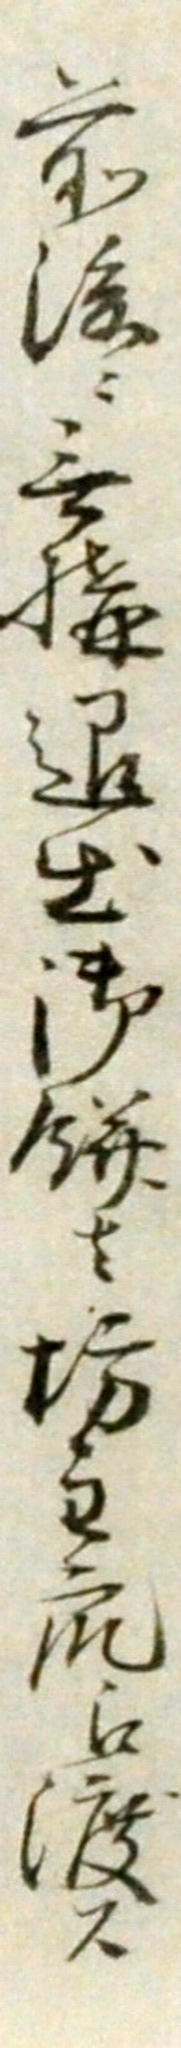前後に無構退出御餅は坊主衆え渡ス

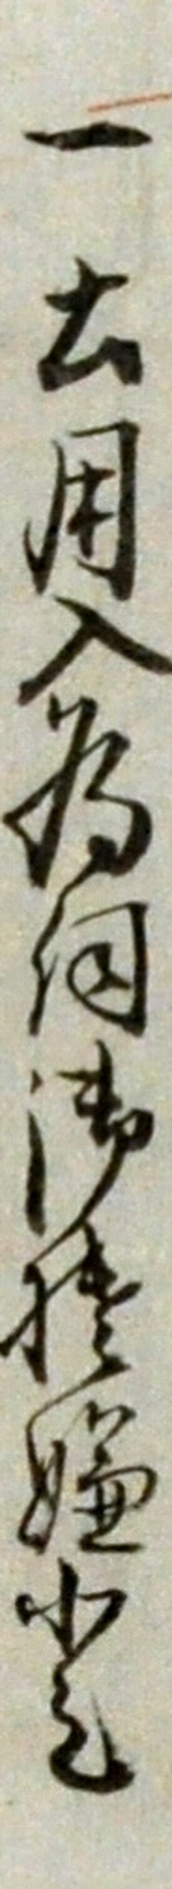一土用入為伺御機嫌登
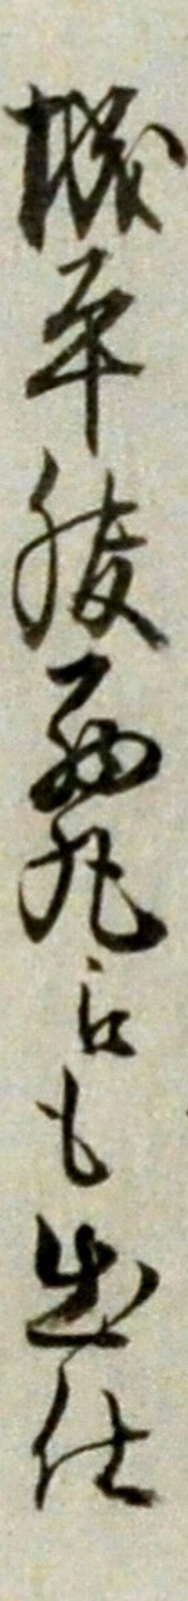城平服西丸えも出仕
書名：申合帳〔一括〕
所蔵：伊那市立高遠町図書館・合同会社AMANE
